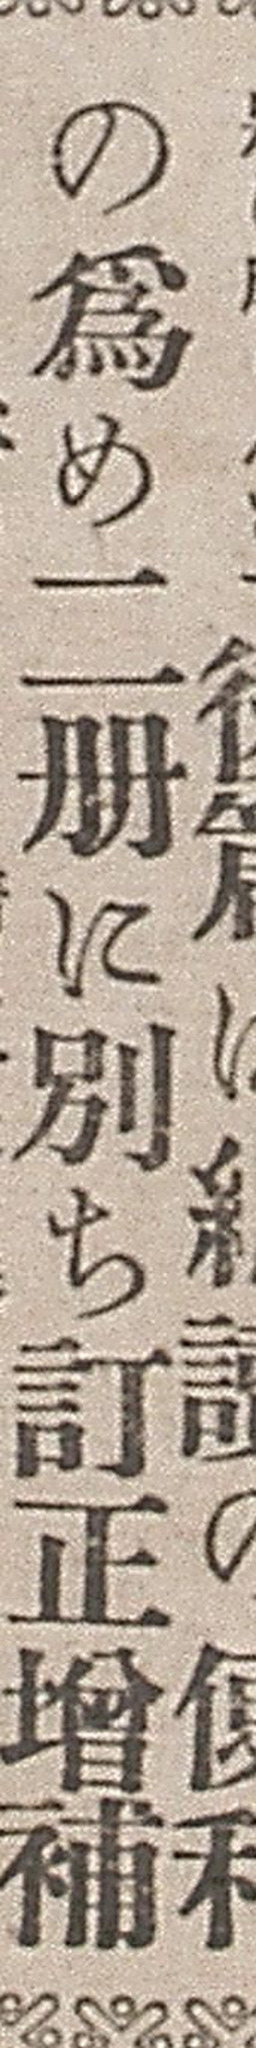の為め二冊に別ち訂正増補
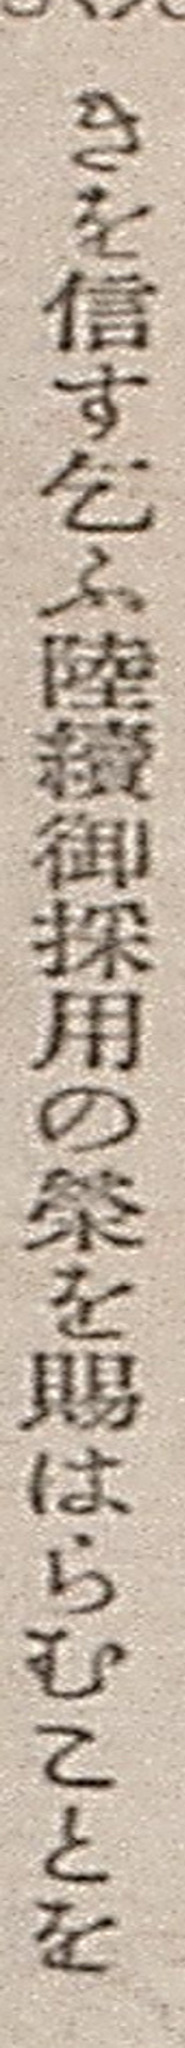きを信す乞ふ陸続御採用の栄を賜はらんことを

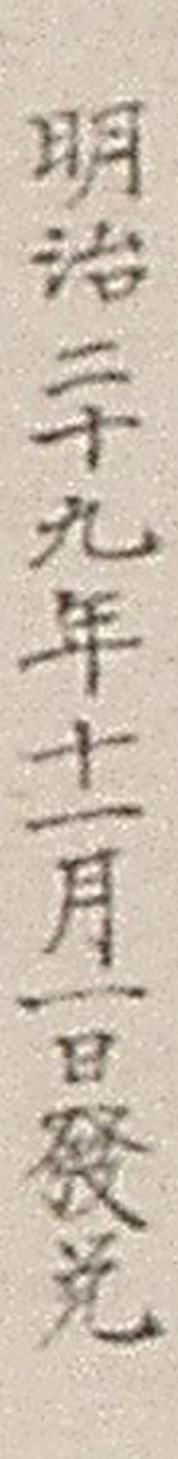明治二十九年十一月一日初兌
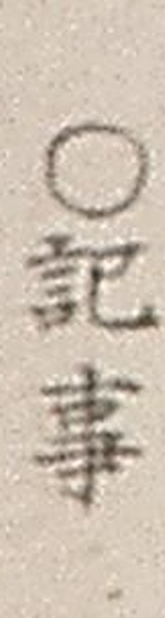◯記事
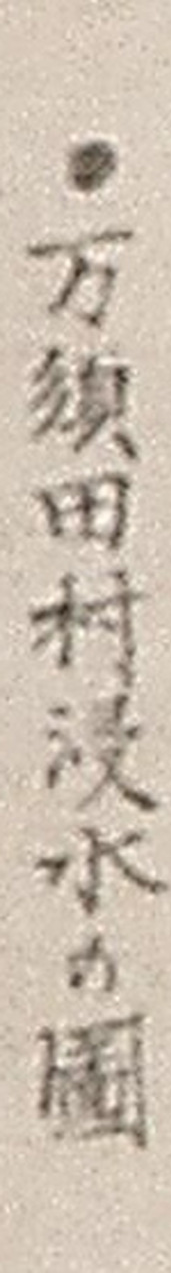●万須田村浸水の圖
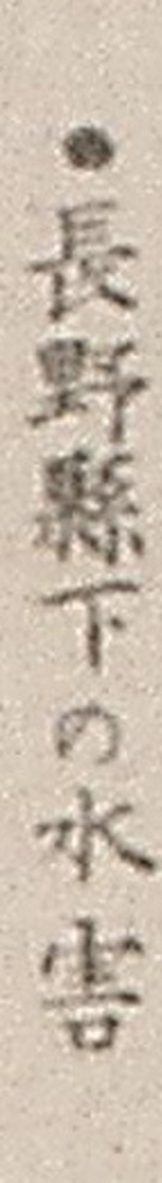●長野県下の水害
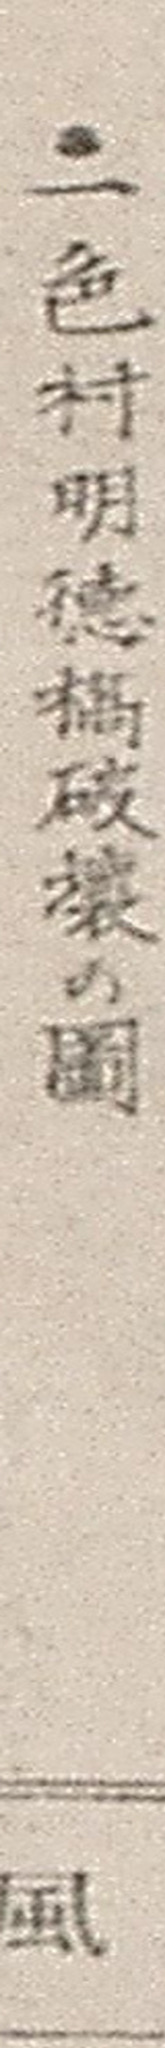●一色村明徳橋破壊の圖
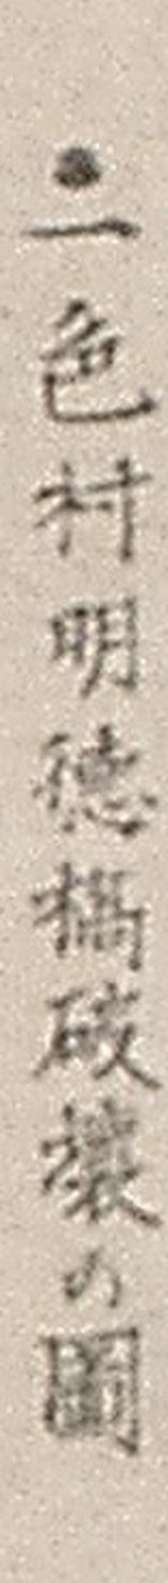●一色村明徳橋破壊の圖
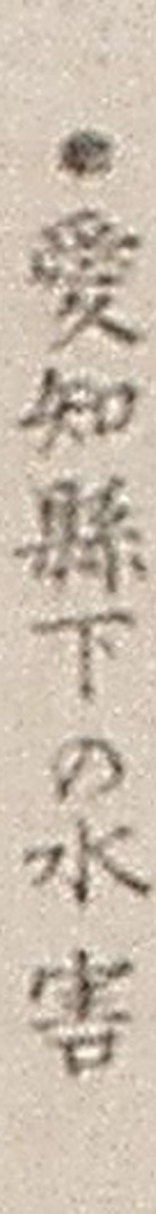●愛知県下の水害
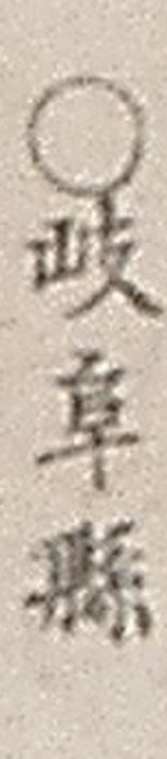◯岐阜県
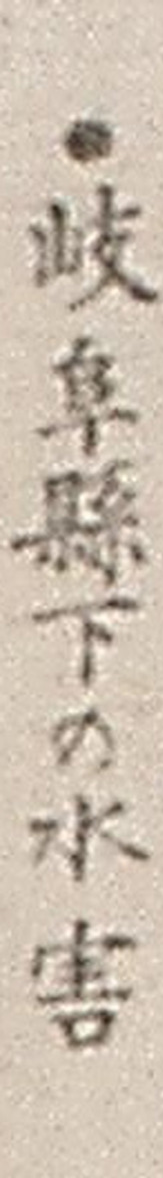●岐阜県下の水害
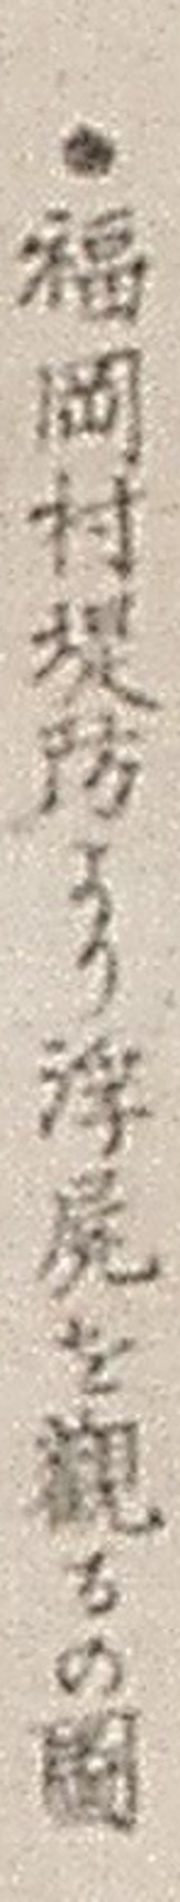●福岡村堤防より浮屍を観るの圖
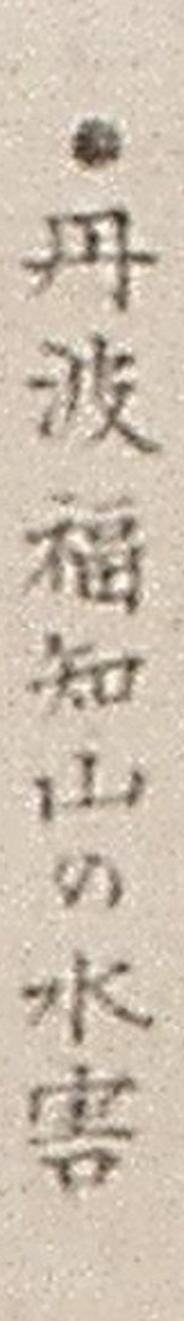●丹波福知山の水害
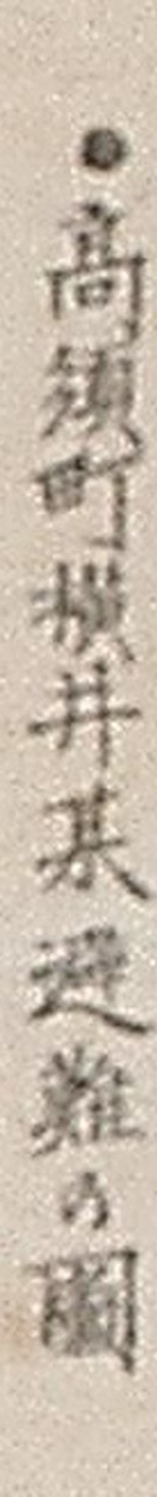●高須町横井某避難の圖
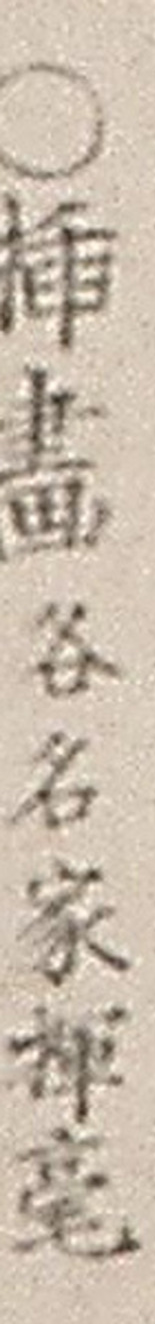◯挿畫各名家揮毫
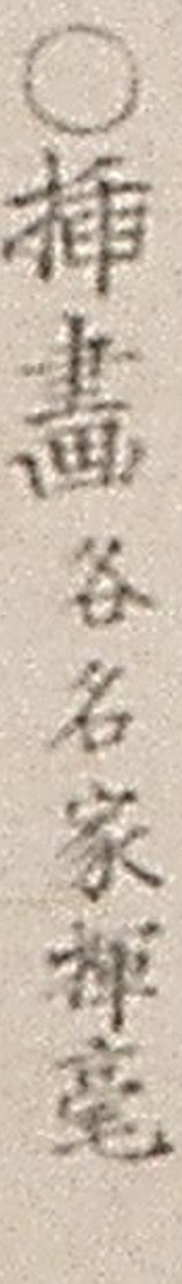◯挿畫各名家揮毫
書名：風俗畫報臨時増刊第百二十六號　洪水被害録（中）
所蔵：東京大学地震研究所図書室 Earthquake Research Institute Library, The University of Tokyo, JAPAN
